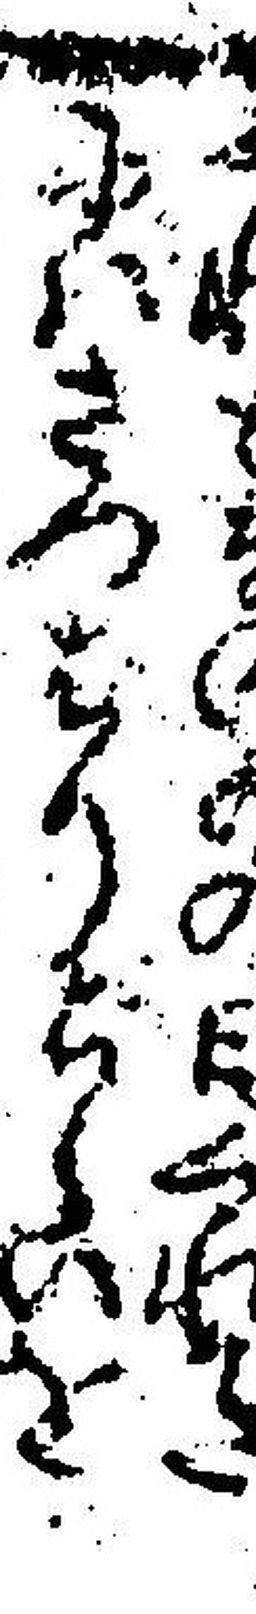にはさつはりはらいを
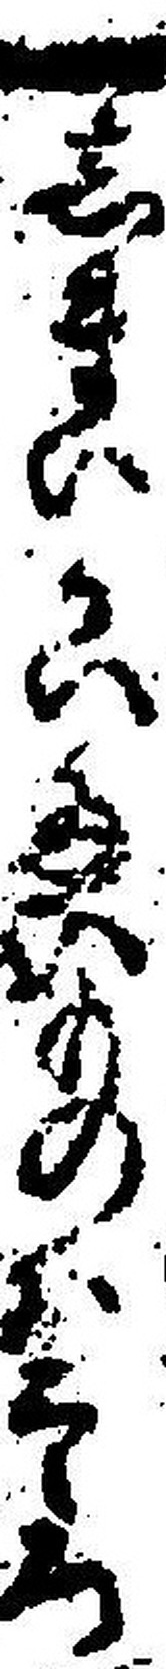しまいかいたいものはこゝろ
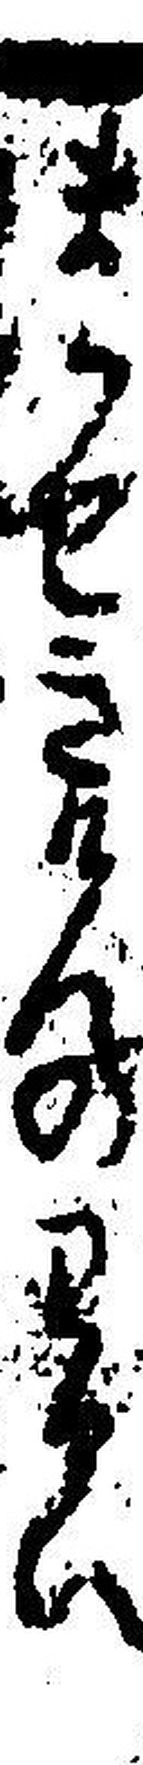まかせきけんのわるい
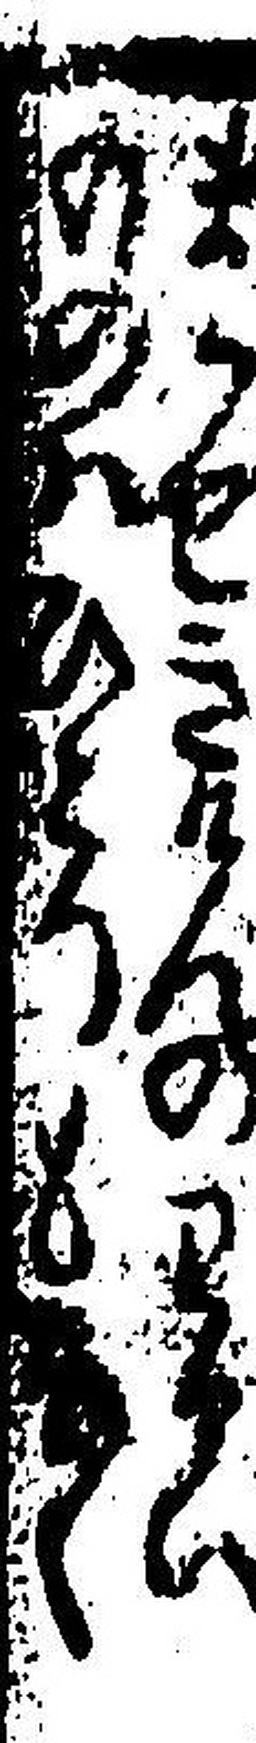ものはひとりもなく
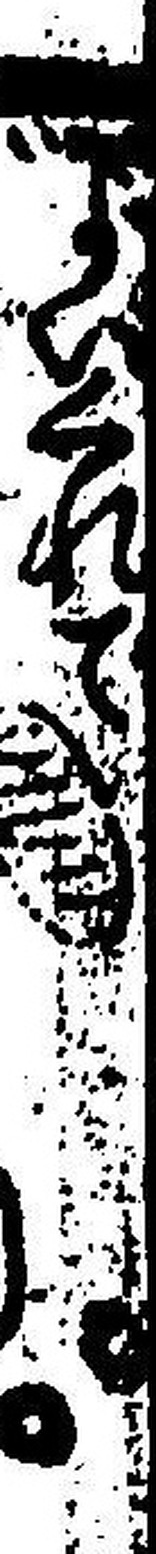よいくれて
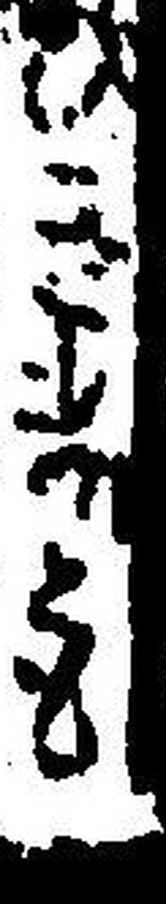ひきまとも
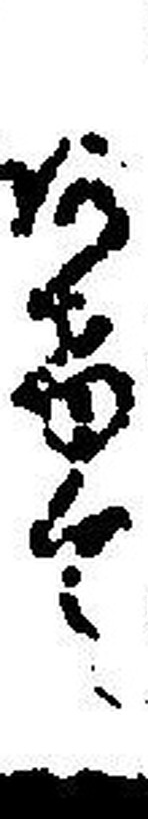あけて
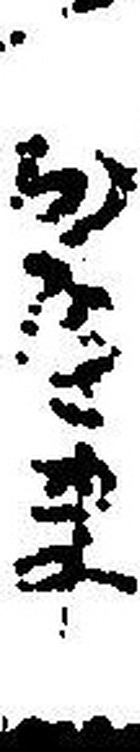おきま
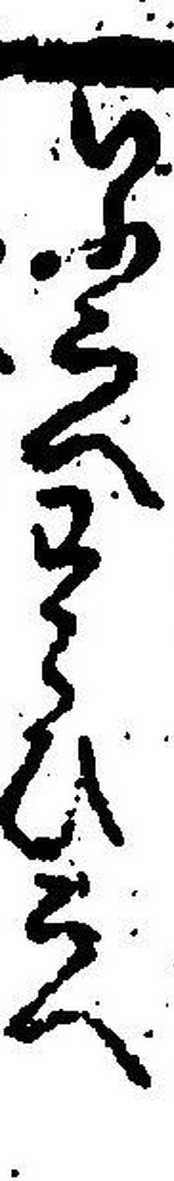いふこへわらひこへ
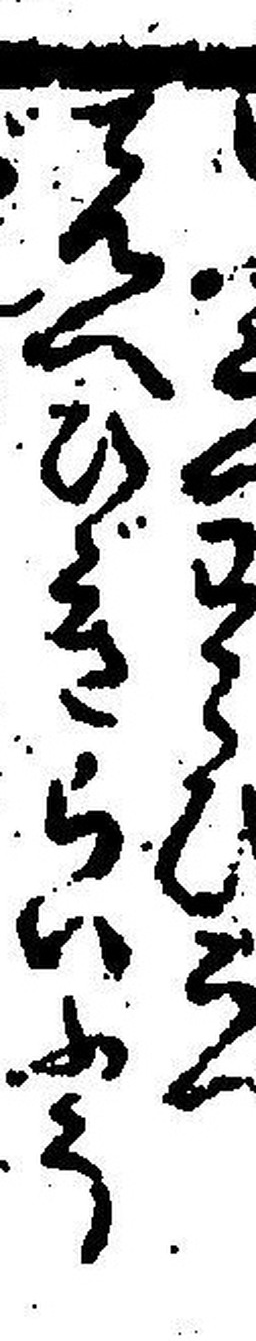てんへひゞきらいふう
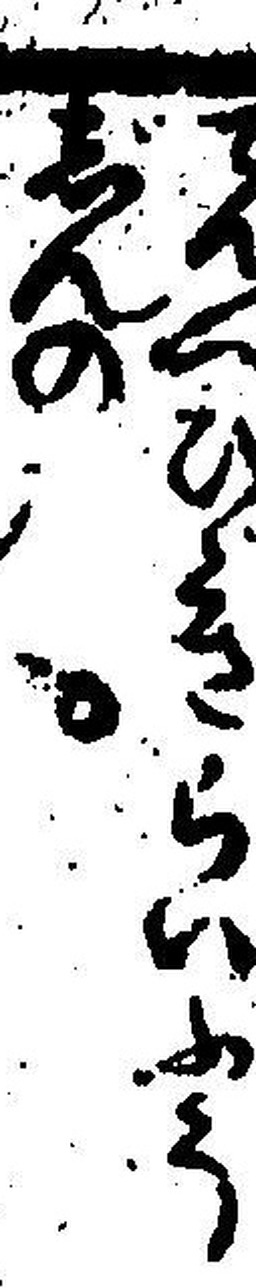じんの
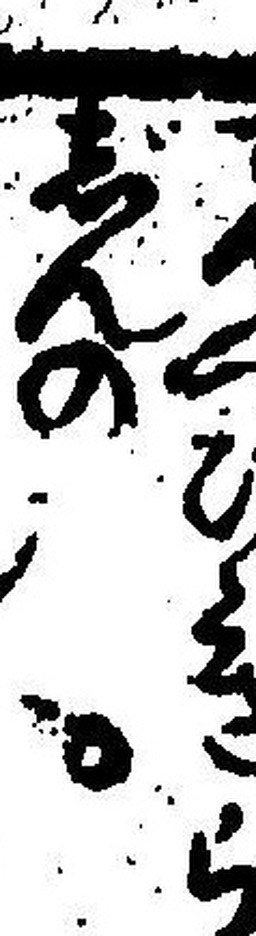じんの
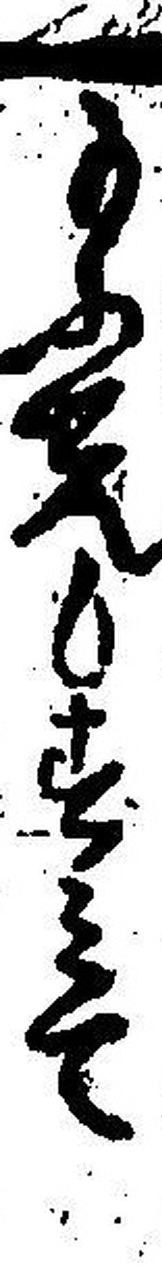もふせんもすみて
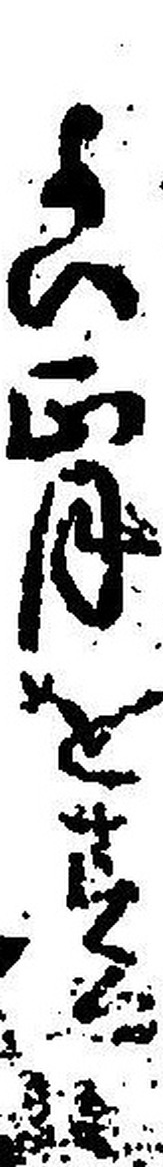よい正月をする
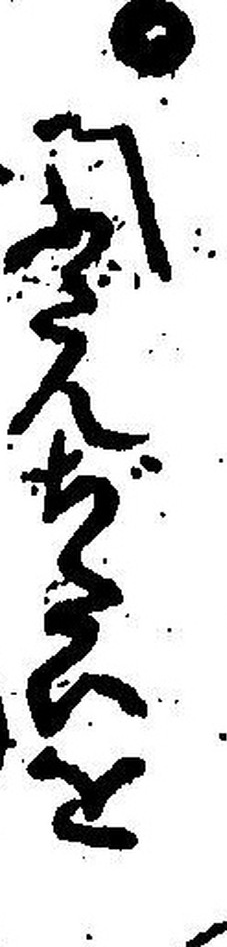〽ふだんぢたいを
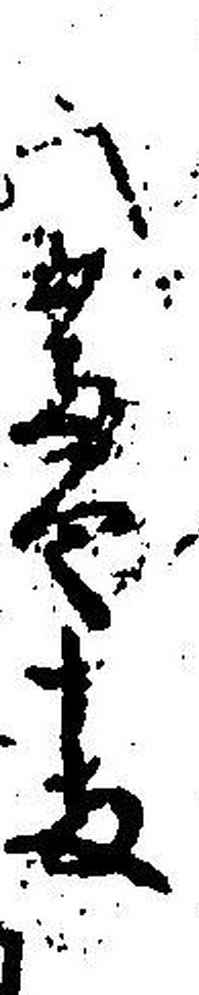〽五両や十両
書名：天竺儲之筋 / 市場通笑作
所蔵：東京大学総合図書館 General Library in the University of Tokyo, JAPAN
